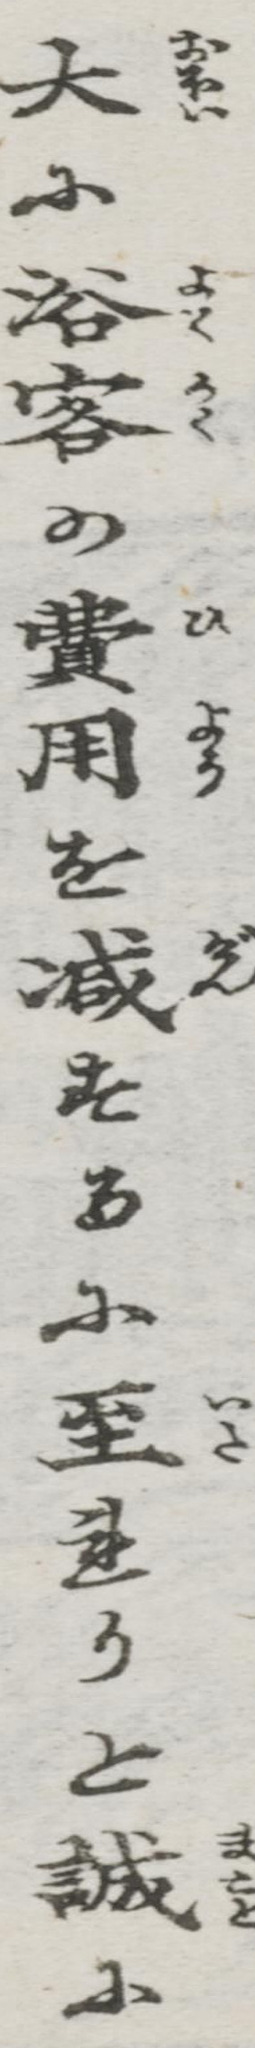大に浴客の費用を減するに至れりと誠に
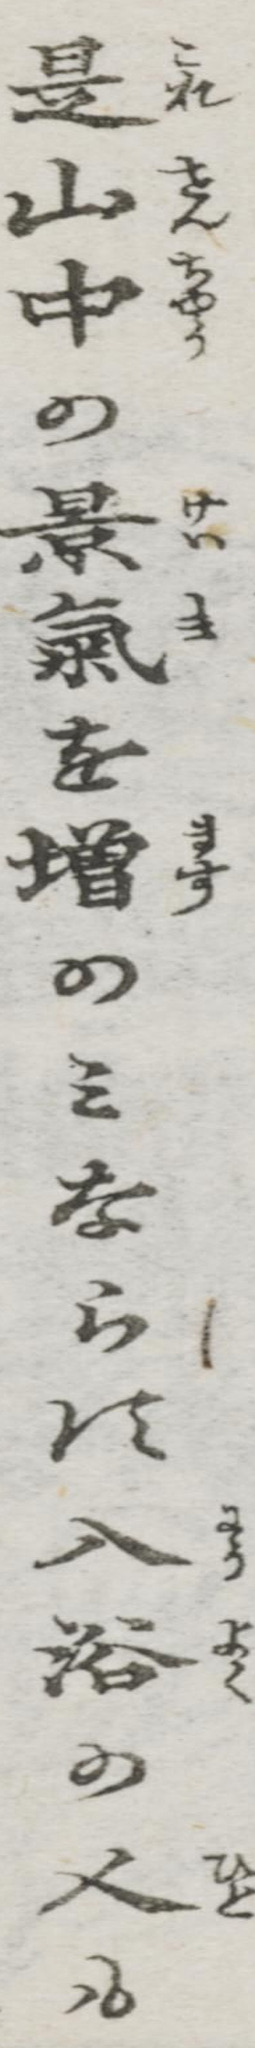是山中の景気を増のミならす入浴の人も
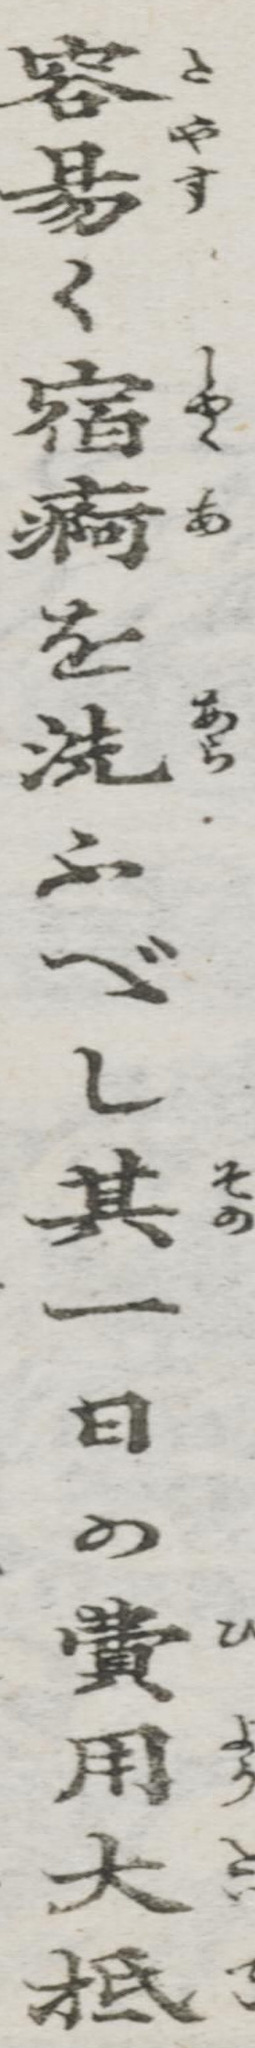容易く宿痾を洗ふべし其一日の費用大抵
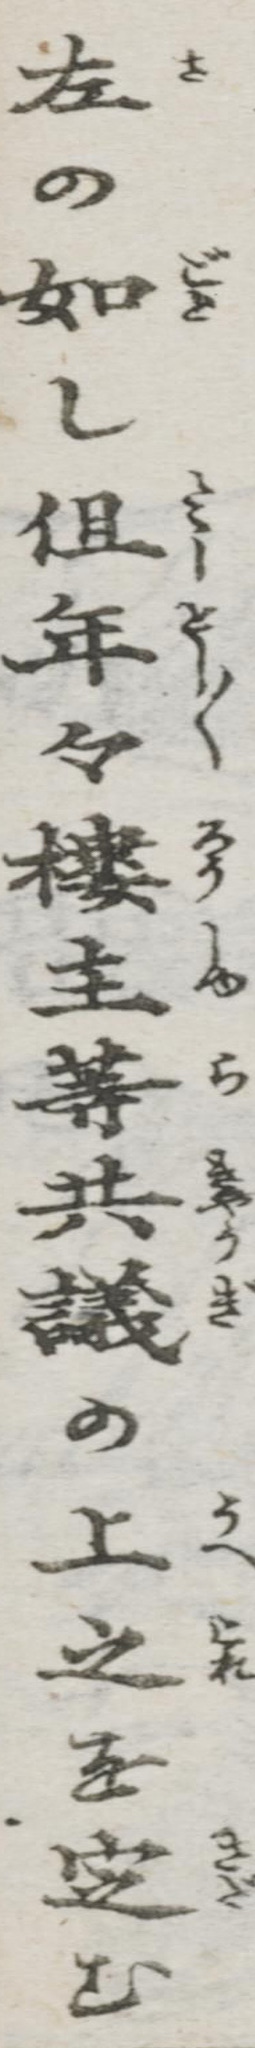左の如し但年々樓主等共議の上之を定む
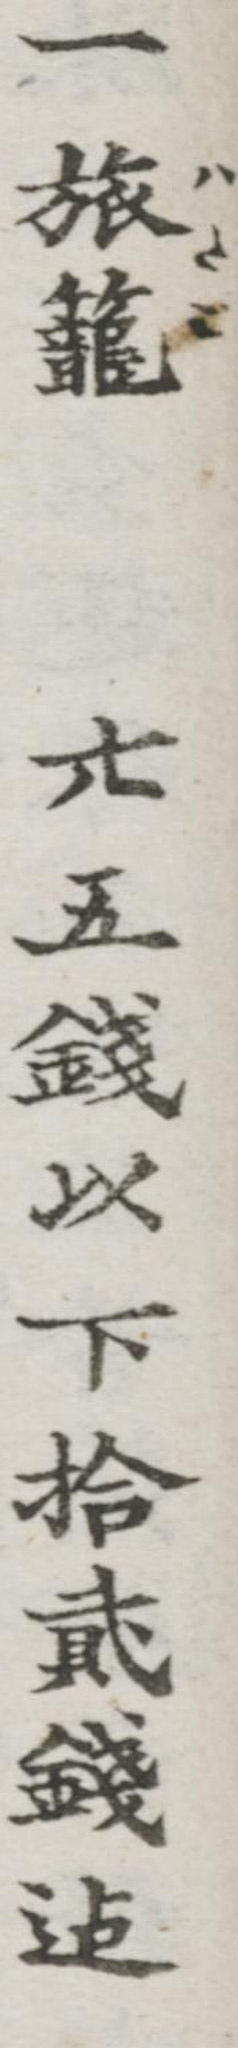一旅籠廿五錢以下拾貮錢迄
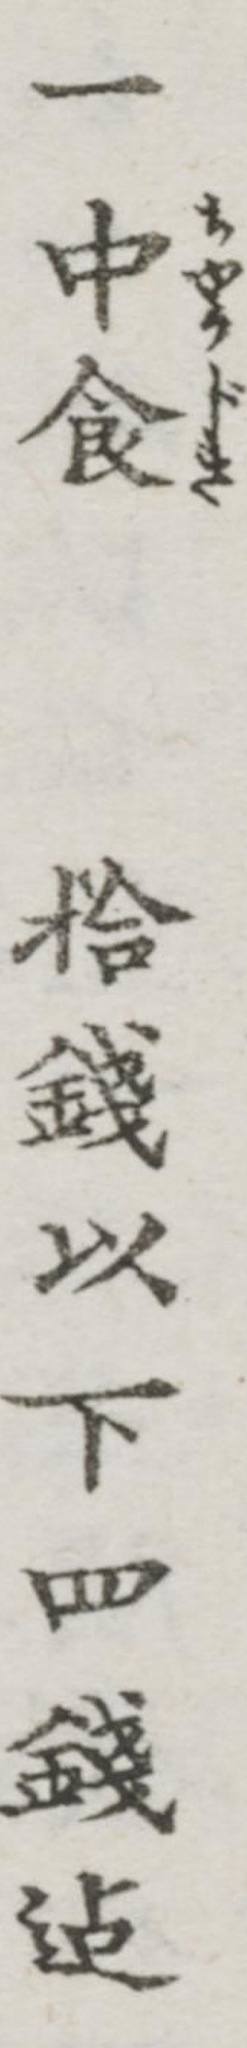一中食拾錢以下四錢迄
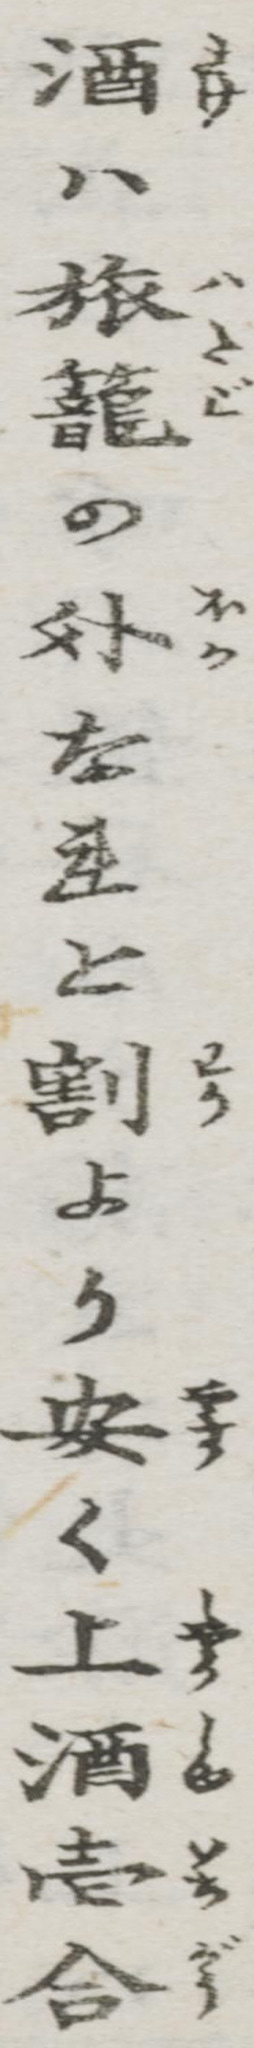酒ハ旅籠の外なれと割より安く上酒壱合
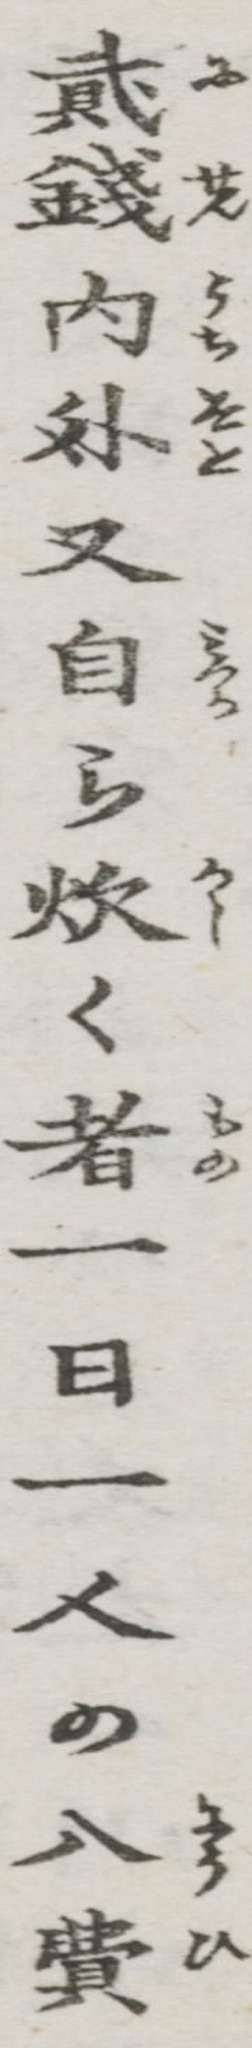貮錢内外又自ら炊く者一日一人の入費
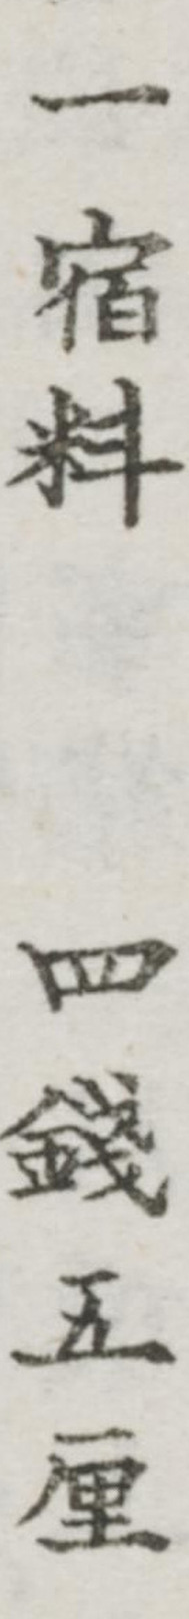一宿料四錢五厘

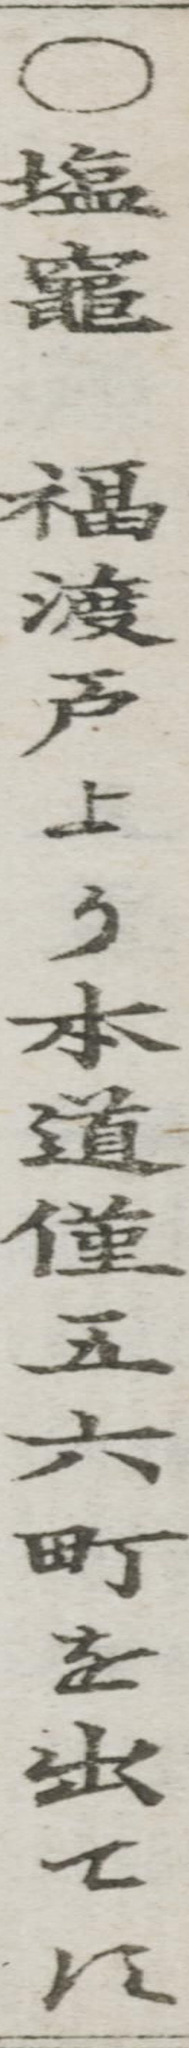○塩竃福渡戸より本道僅五六町を出てす
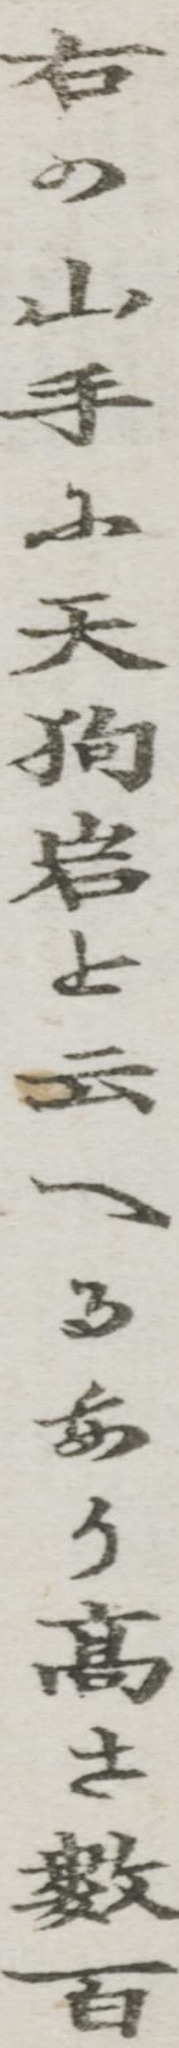右の山手に天狗岩と云へるあり高さ数百
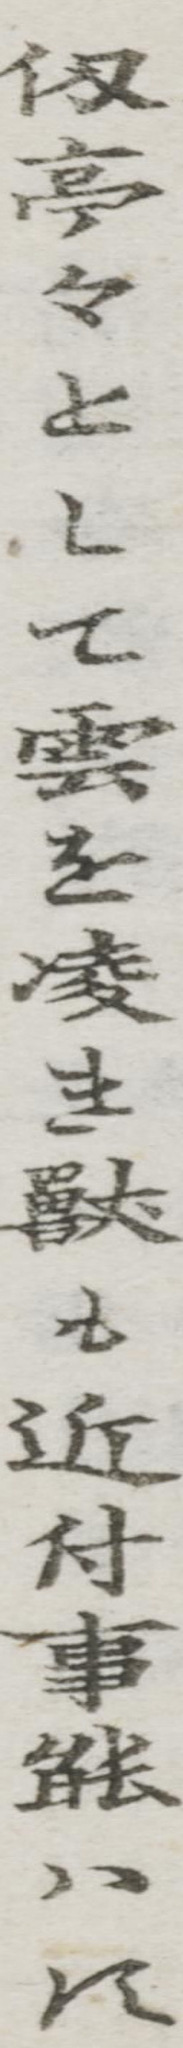仭亭々として雲を凌き獣も近付事能はす
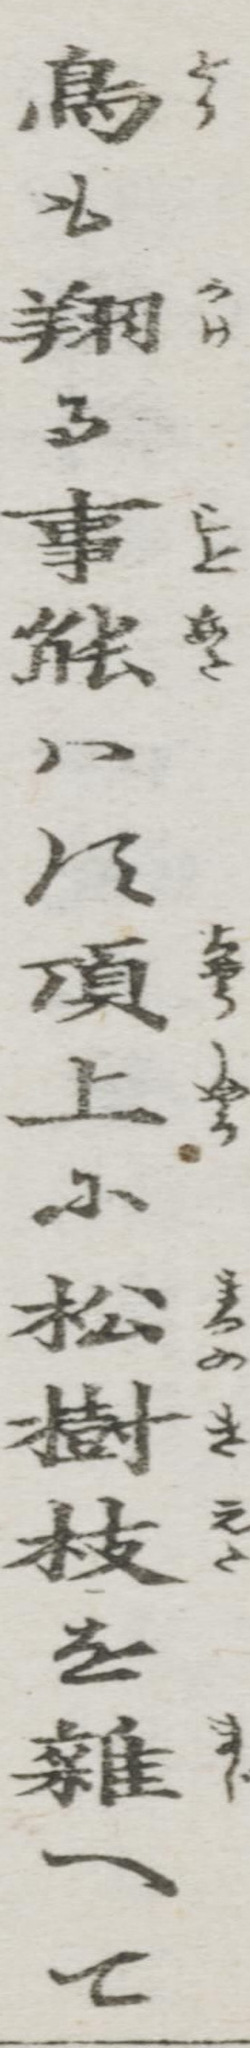鳥も翔る事能はす頂上に松樹枝を雑へて
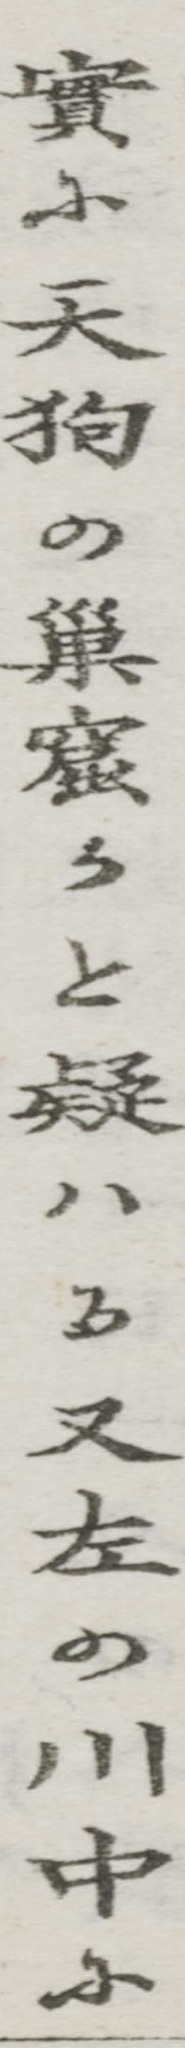實に天狗の巣窟かと疑はる又左の川中に
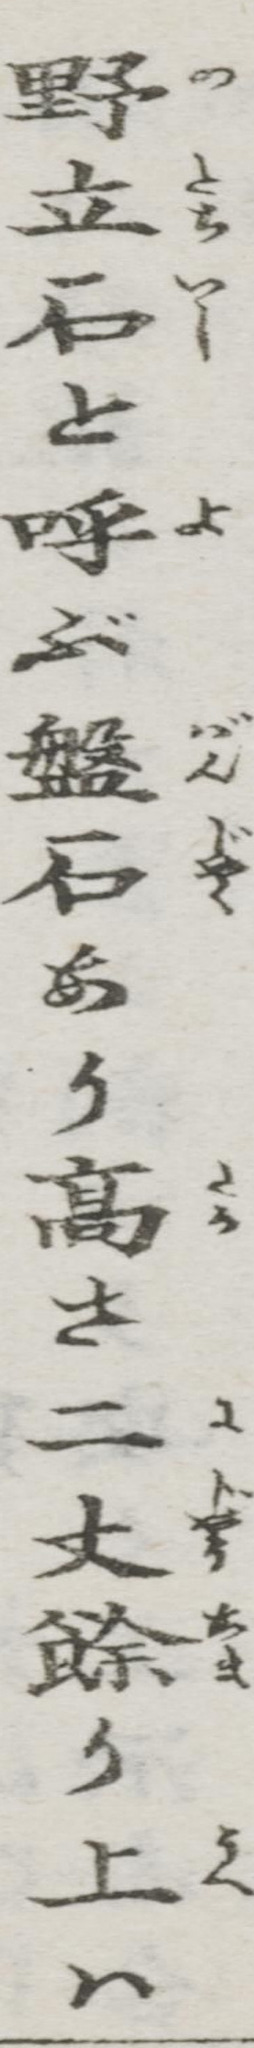野立石と呼ぶ盤石あり高さ二丈餘り上は
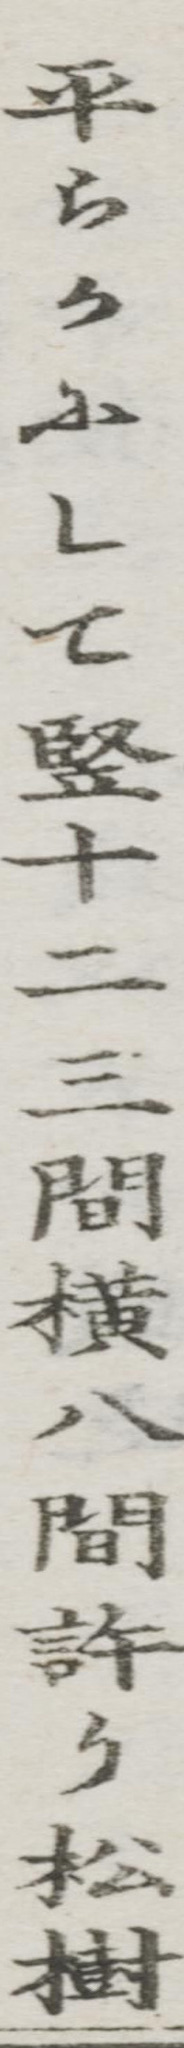平らかにして竪十二三間横八間許り松樹
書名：塩原繁昌記　全
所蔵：東京大学地震研究所図書室 Earthquake Research Institute Library, The University of Tokyo, JAPAN
